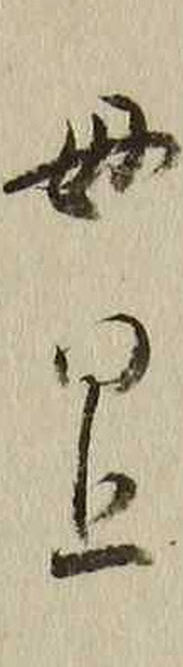母同上
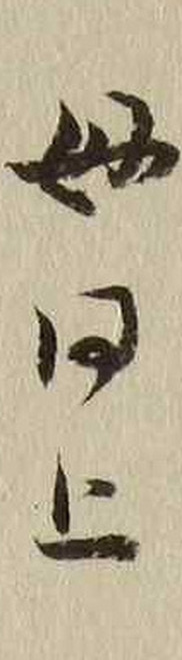母同上
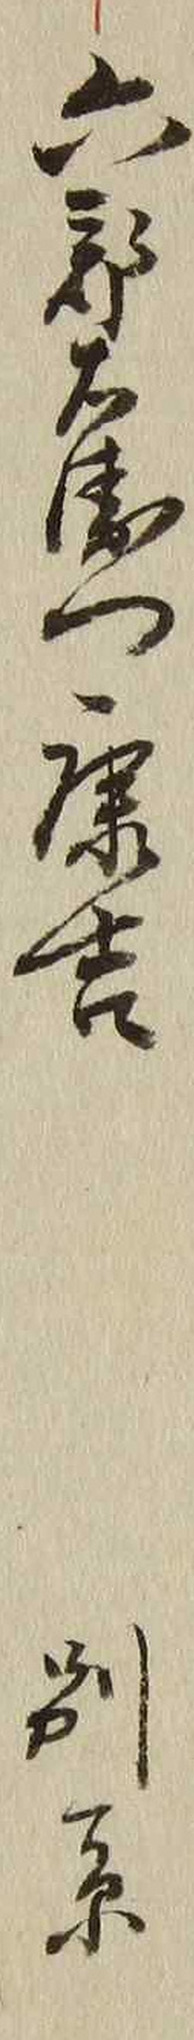六郎右衛門康吉別系
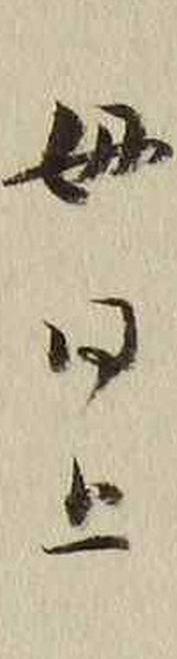母同上
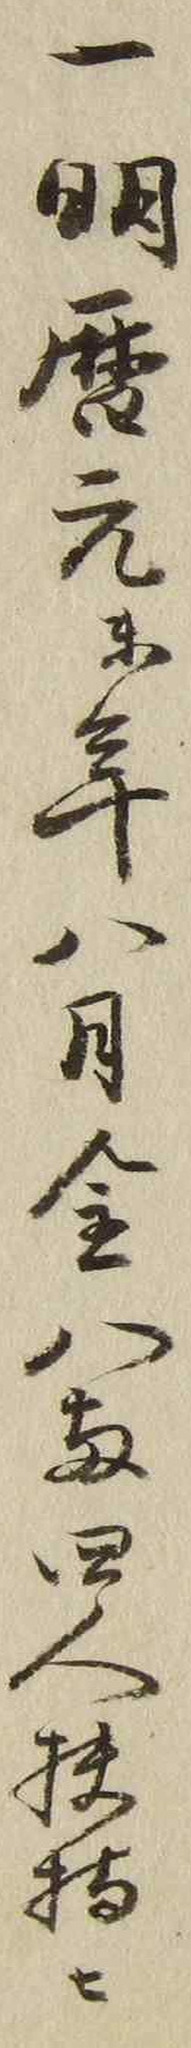一明暦元未年八月金八両四人扶持被

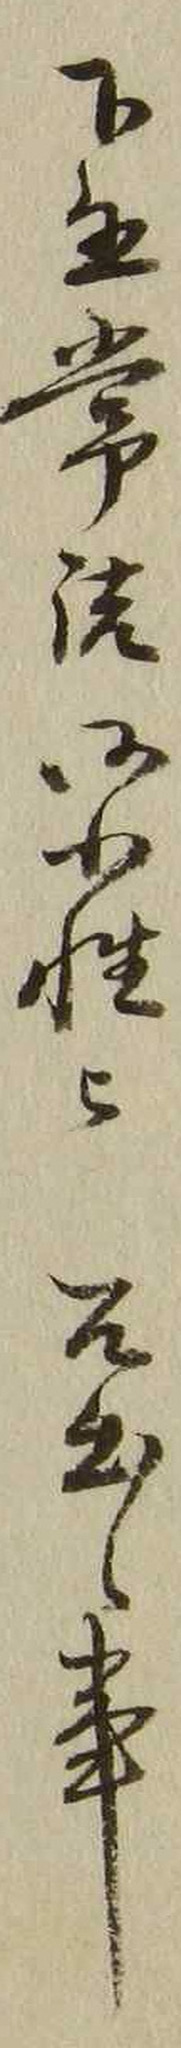下置常詰御小性被召出候事
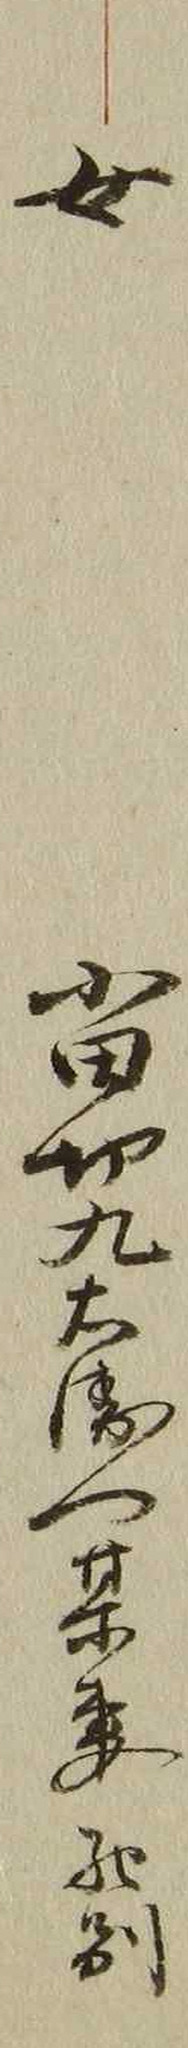女小田切九右衛門某妻死別
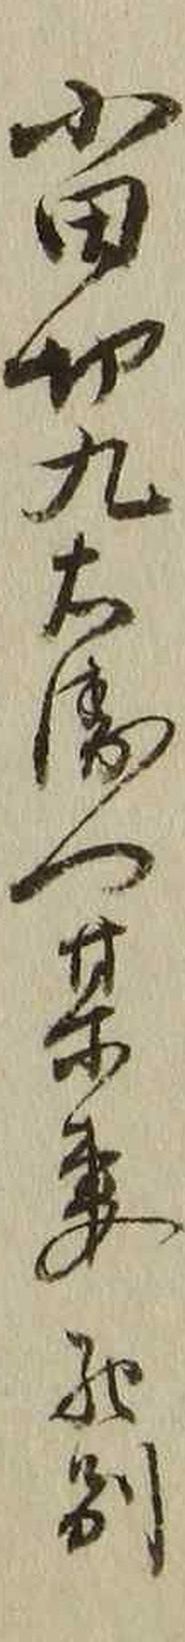女小田切九右衛門某妻死別
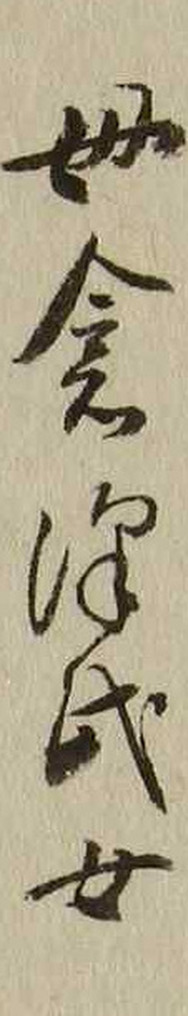母倉沢氏女
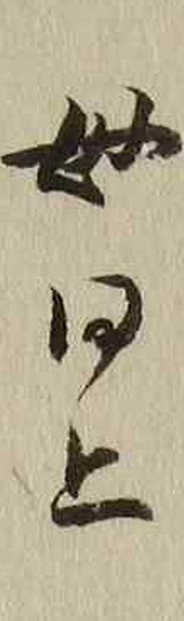母同上
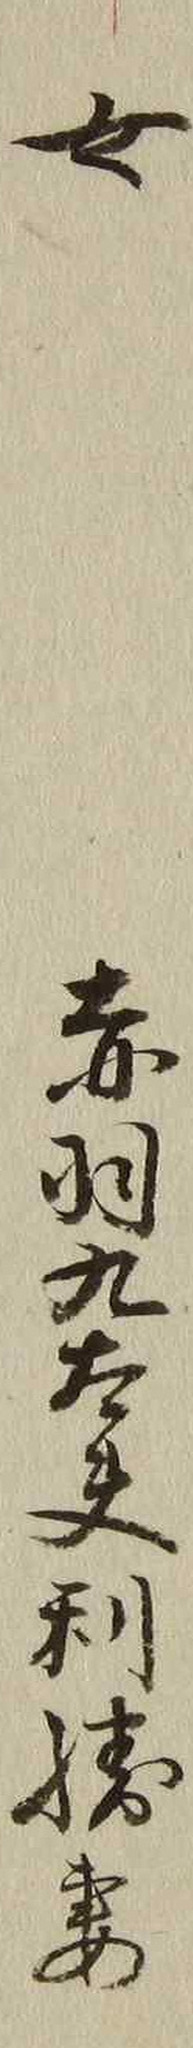女赤羽九太夫利勝妻
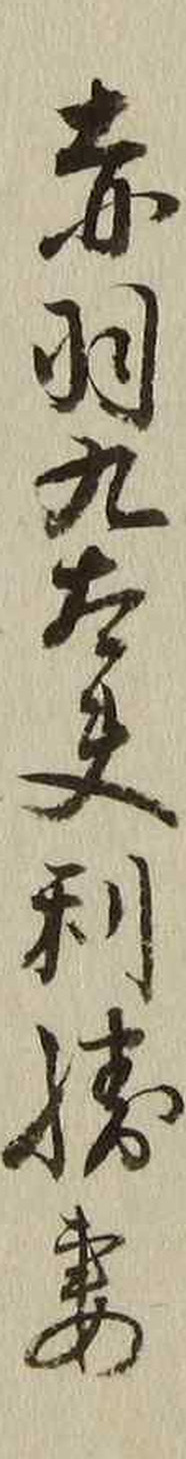女赤羽九太夫利勝妻
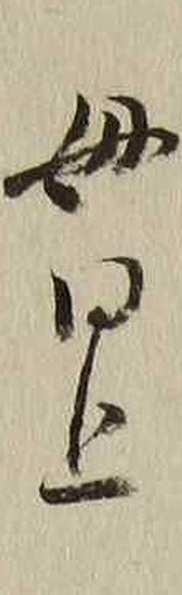母同上
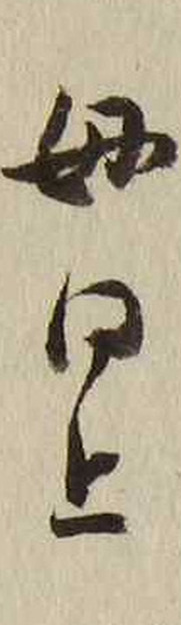母同上

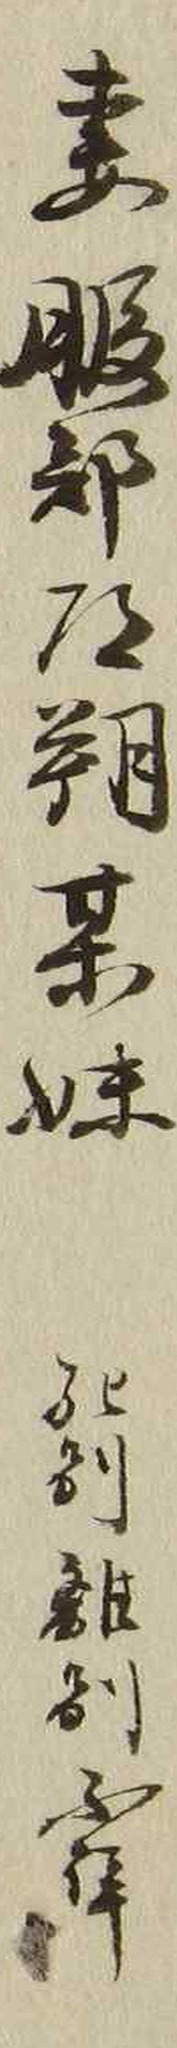妻服部道朔某妹死別離別不詳
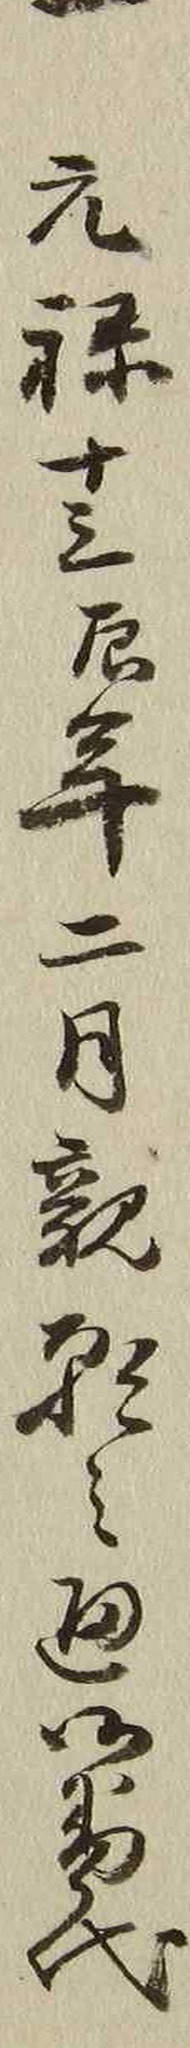一元禄十三辰年二月親願之通御番代
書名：諸士系譜　巻之236　ふ之部4
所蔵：会津若松市立会津図書館
